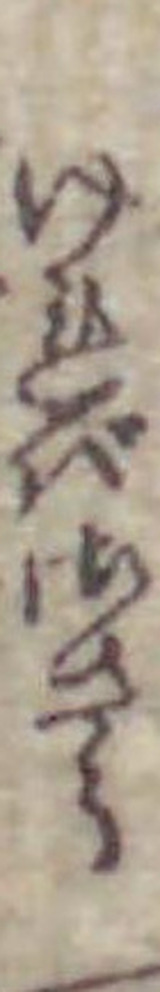ければ御さう
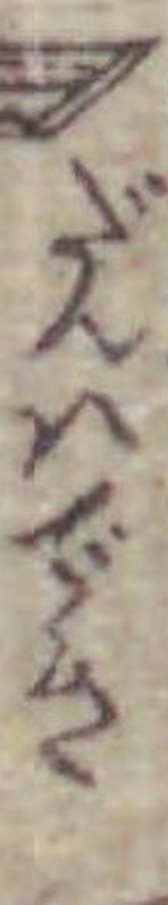だんはでき
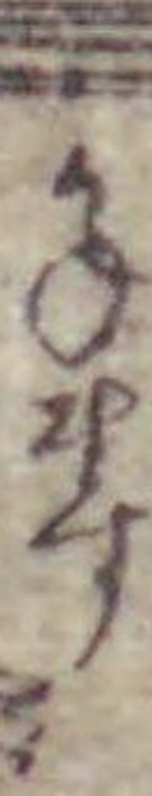かねます
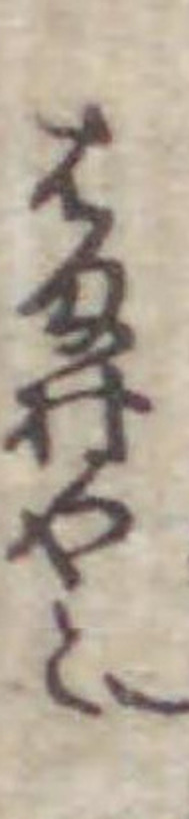はま村やと
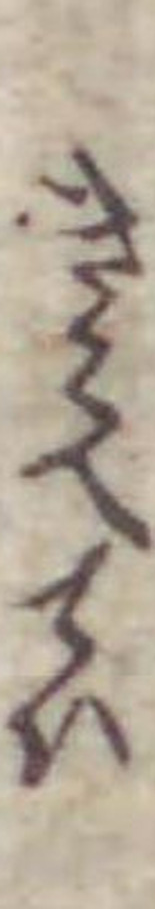きこへては
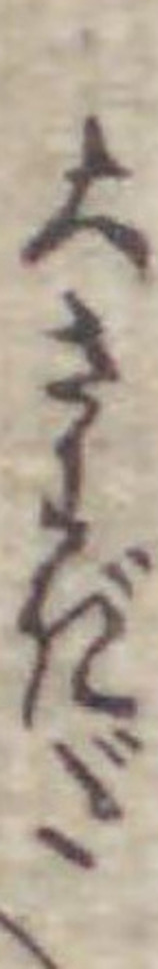大さわぎだ
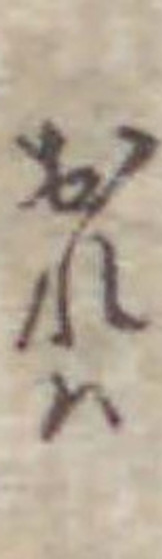おれは
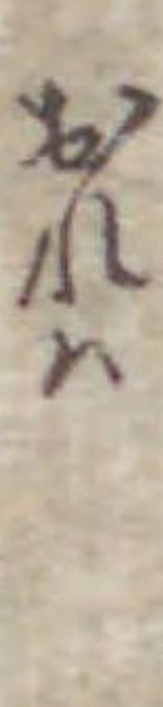おれは

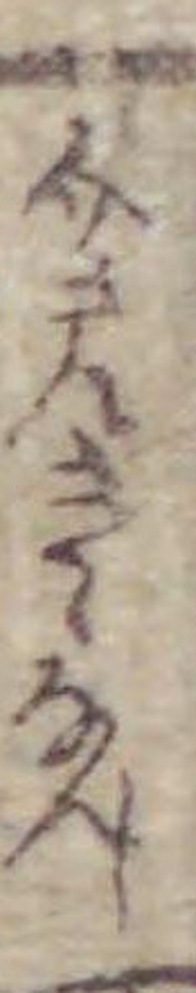介さんきゝなんし
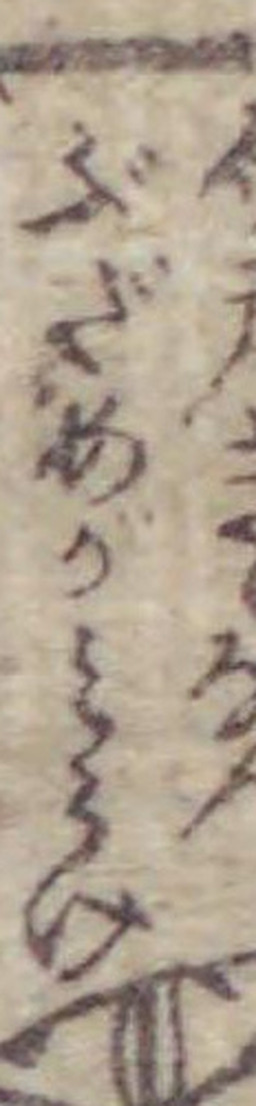ぶざめがみうけ
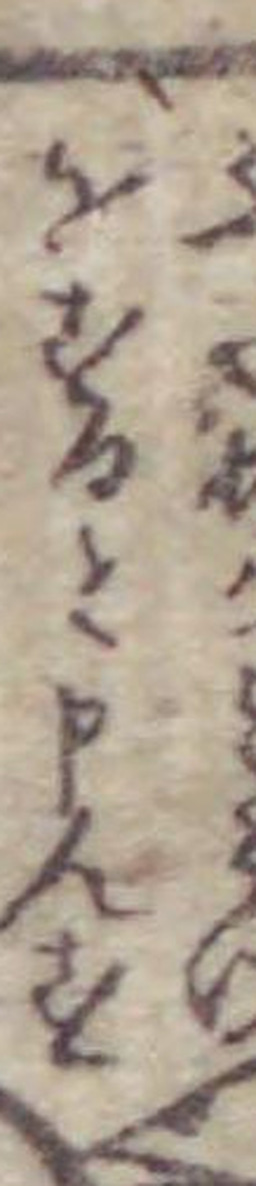をすると申んす
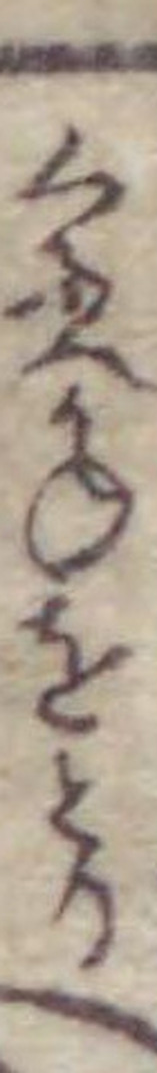くにへかねをとり
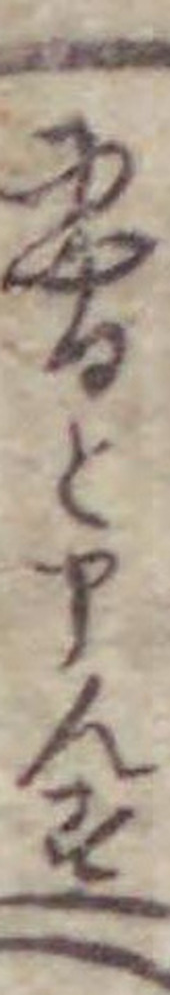にやると申んす
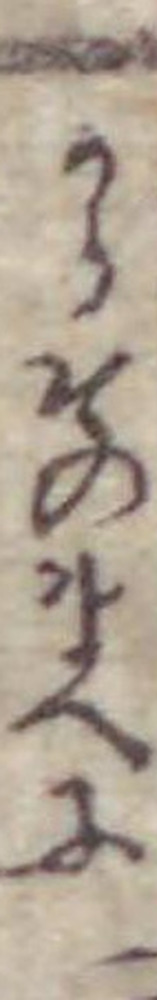からそのまへに
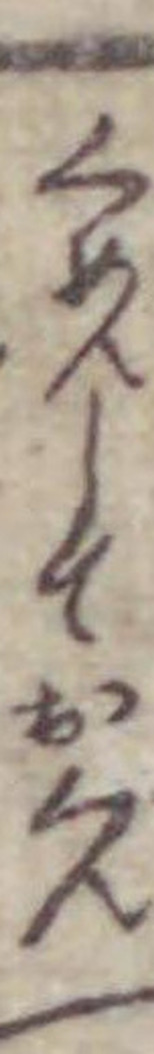くめんしておくん
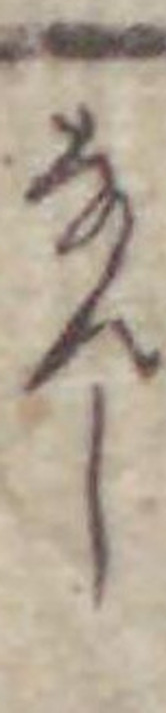なんし
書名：嗚呼不侭世之助噺 : 3巻
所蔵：国立国会図書館 National Diet Library, JAPAN
